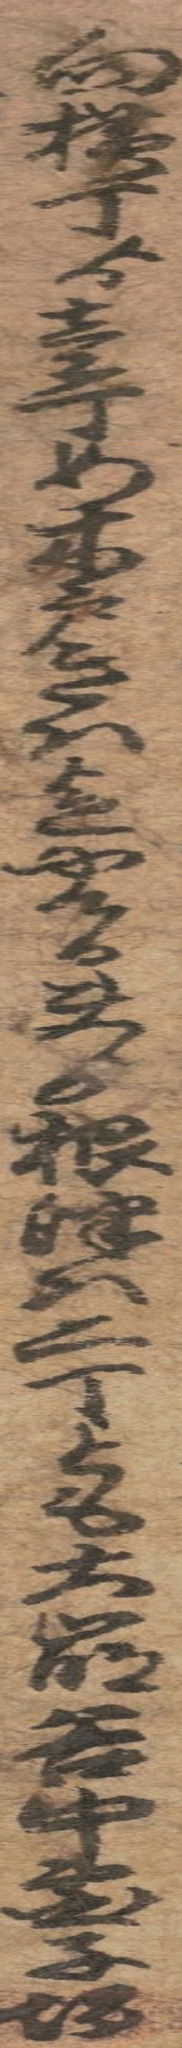向横丁ゟ壱丁め木戸きハ迄やける夫ゟ根津ハ二丁とも大崩谷中団子坂
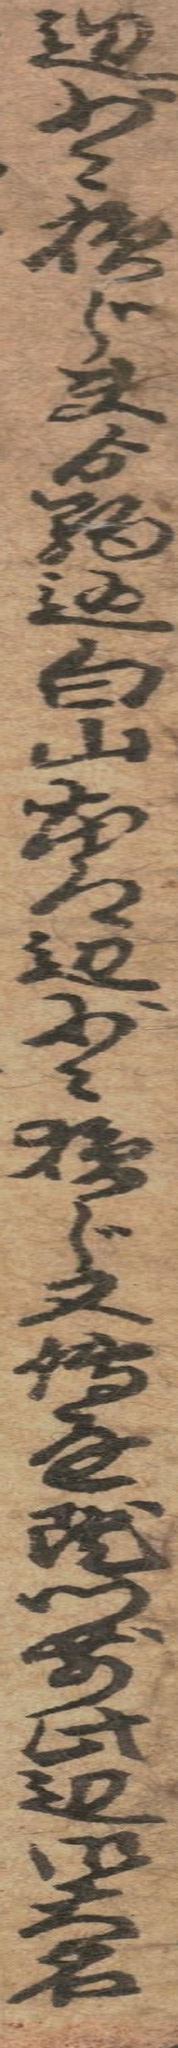辺少々損じ夫ゟ駒込白山本郷辺少々損じ又伝通院門前此辺御大名
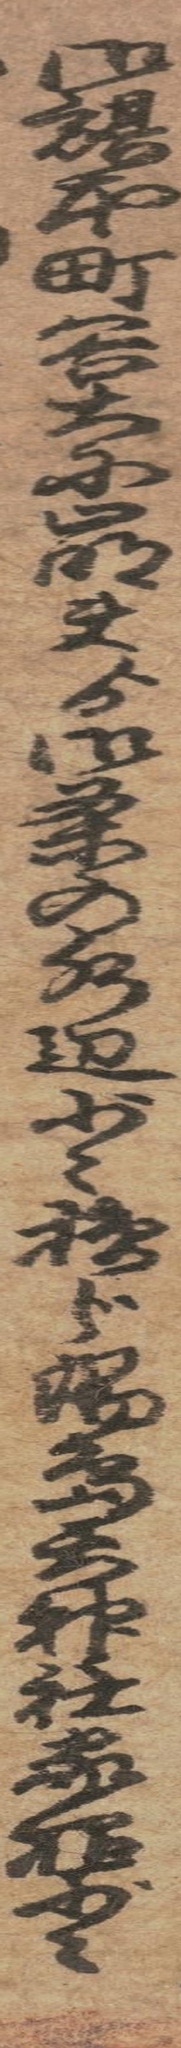御旗本町谷大に崩夫ゟ御桑の水辺少々損じ湯島大神社家根少々
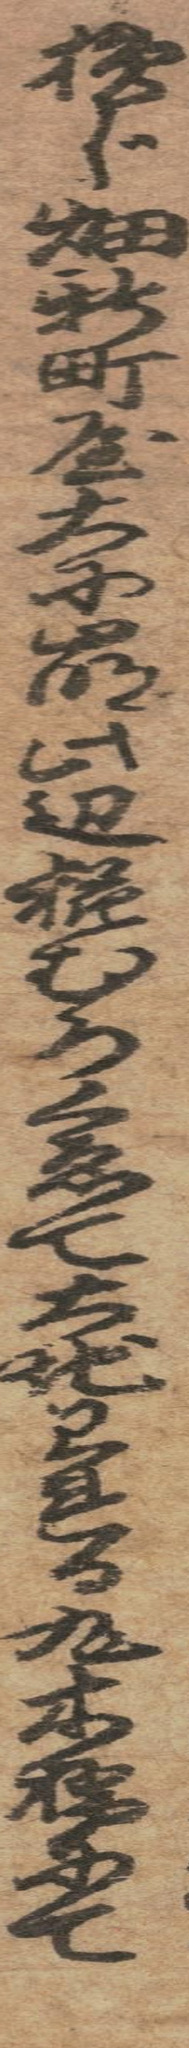損じ畑新町屋大に崩此の辺糀むろくゑて大地われる丸木橋にて
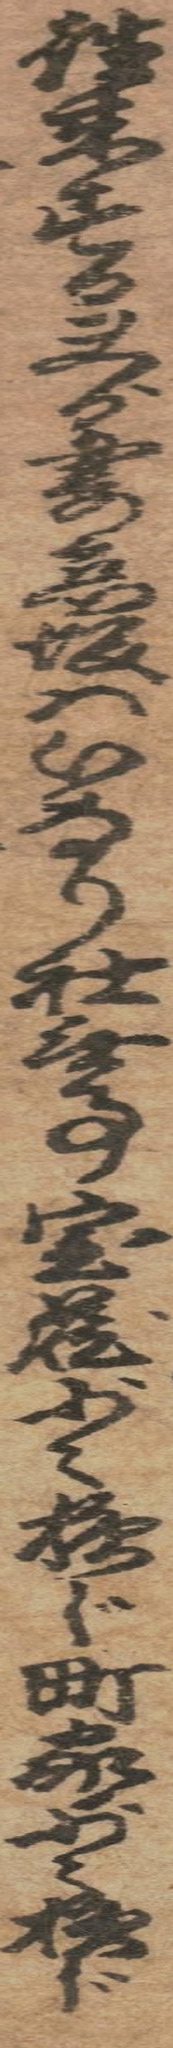往来する夫ゟ妻恋坂ハいなり社無事宝蔵少々損じ町家少々損じ
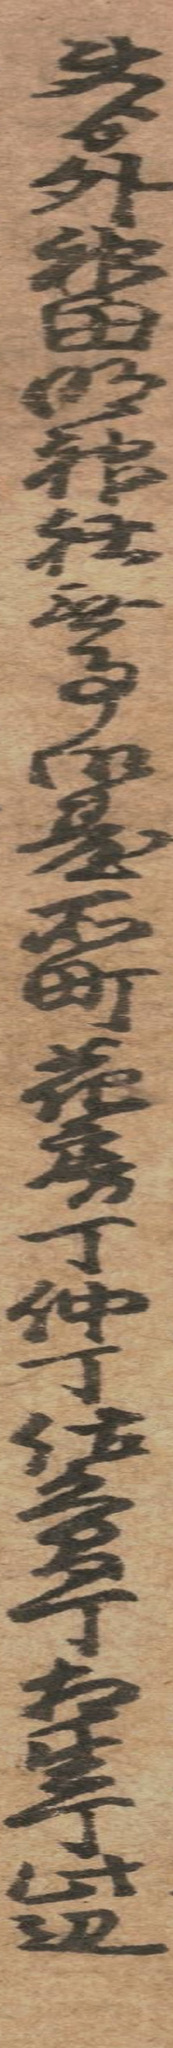夫ゟ外神田明神社無事御台所町花房丁仲丁佐久間丁相生丁此辺
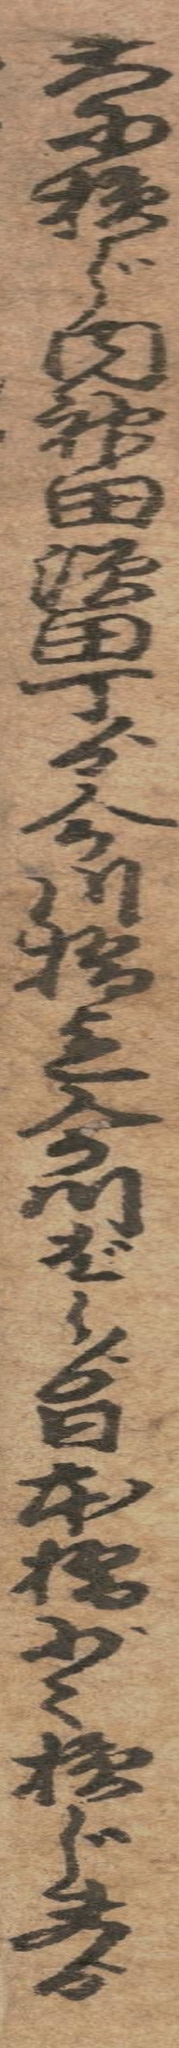大に損じ内神田浜田丁ゟ今川橋迄今川ばしゟ日本橋少々損じ夫ゟ
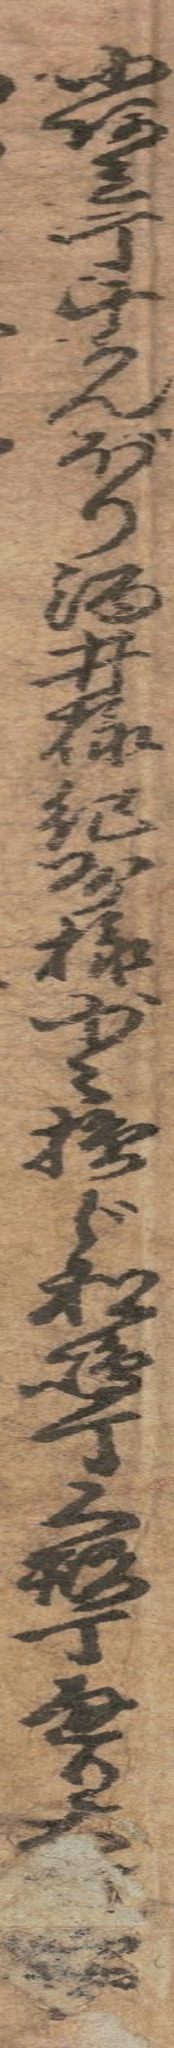小あミ丁やけんぼり酒井様紀州様少々損じ松崎丁く形丁通り大
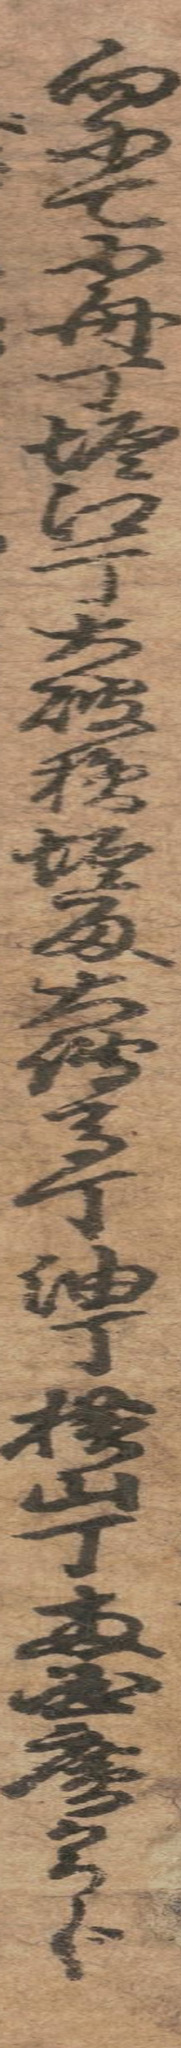向にて小舟丁堀江丁大破損塩留大伝馬丁油丁檜山丁両国広かうじ
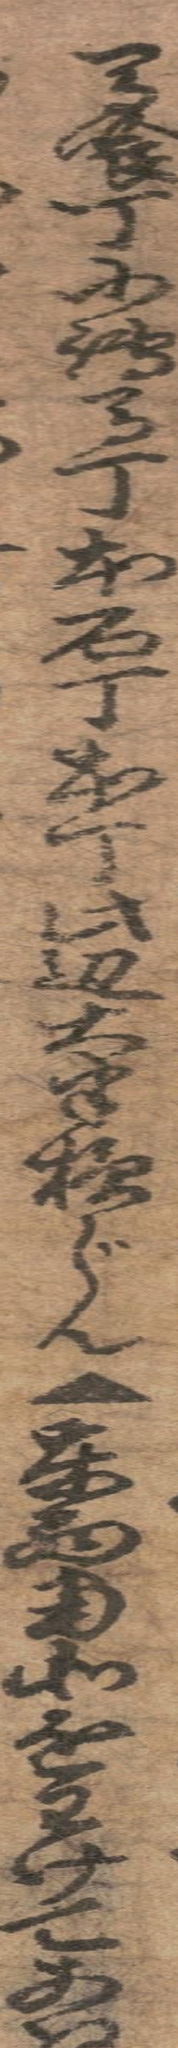馬食丁小伝馬町本石丁本丁此辺大半損じん▲東西南北をわけてあき
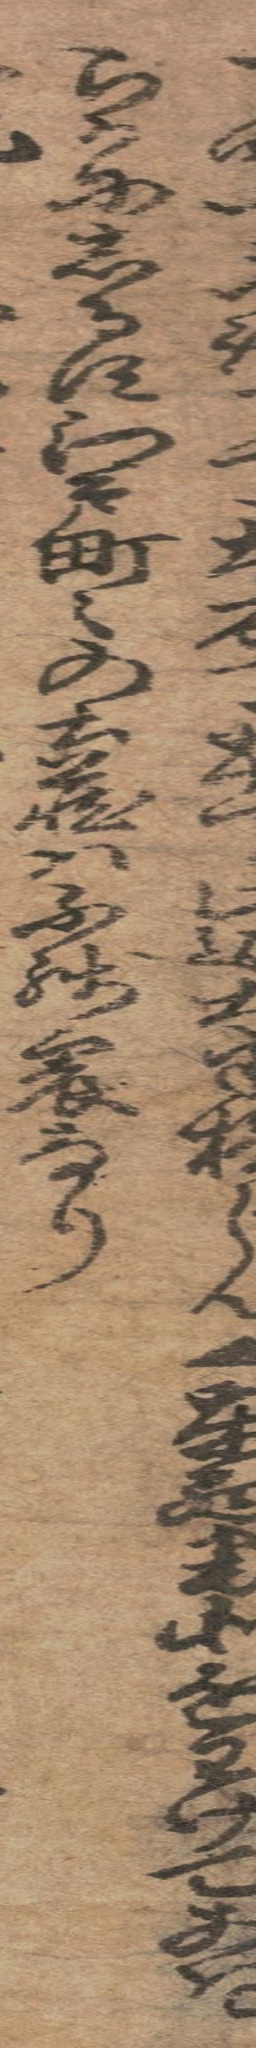らかにしるす江戸町々の土蔵ハ不残震なり
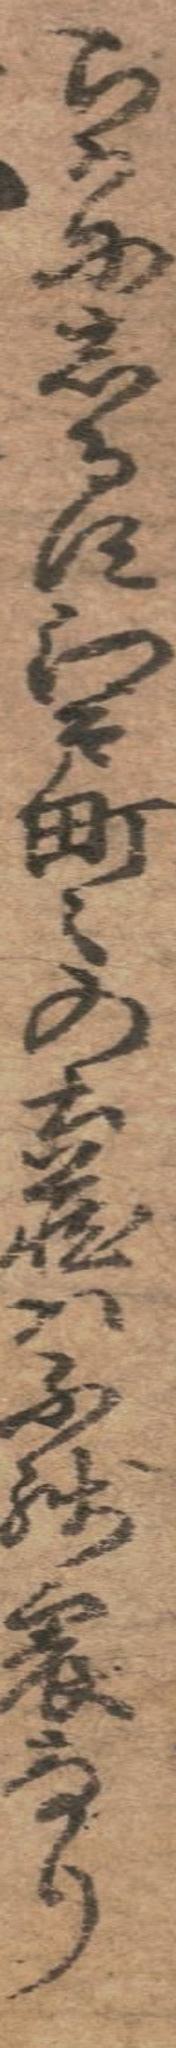らかにしるす江戸町々の土蔵ハ不残震なり
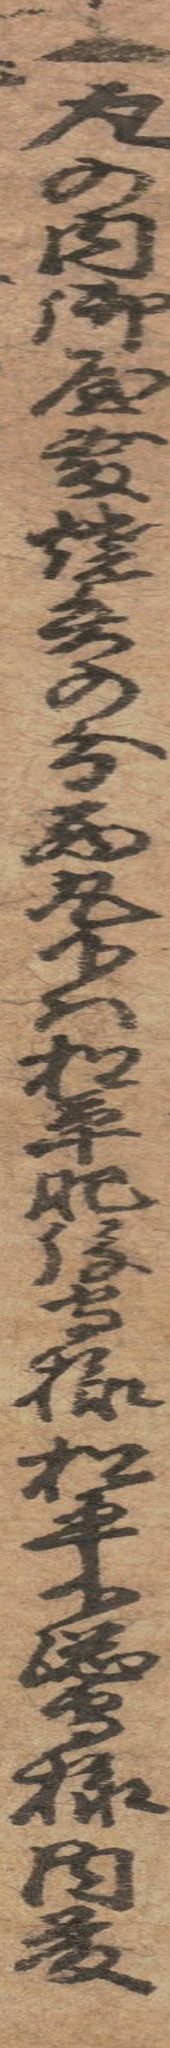▲丸の内御屋敷焼失の分西丸下ハ松平肥後守様松平下総守様内藤
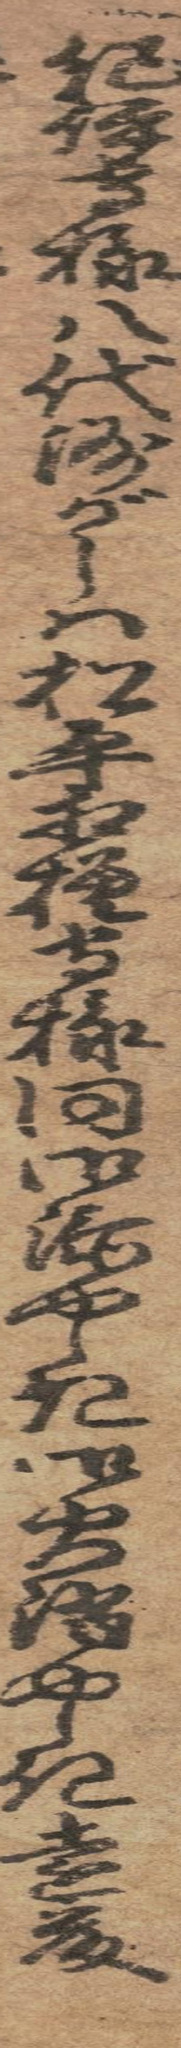紀伊守様八代洲がしハ松平相模守様同御浜やしき御火消やしき遠藤
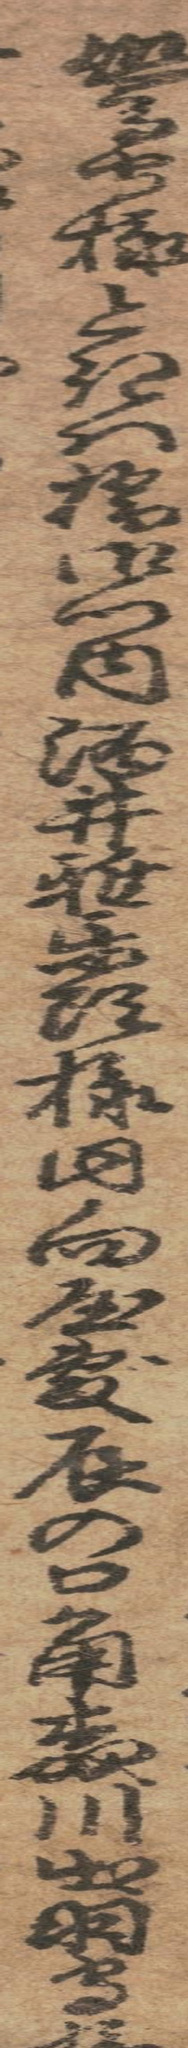但馬守様ときハ橋御門内酒井雅楽頭様同向屋敷辰の口角森川出羽守様
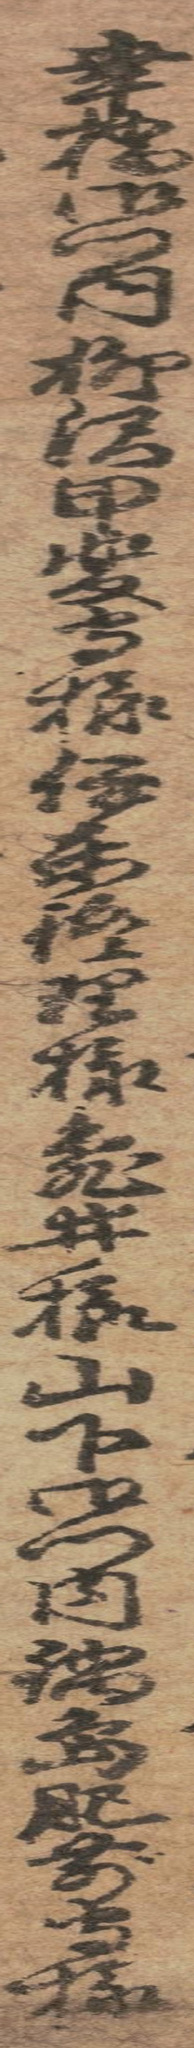幸橋御門内柳沢甲斐守様伊奈修理様亀井様山下御門内鍋嶋肥前守様
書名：[安政江戸地震に関する瓦版]
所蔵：東京大学地震研究所図書室 Earthquake Research Institute Library, The University of Tokyo, JAPAN
